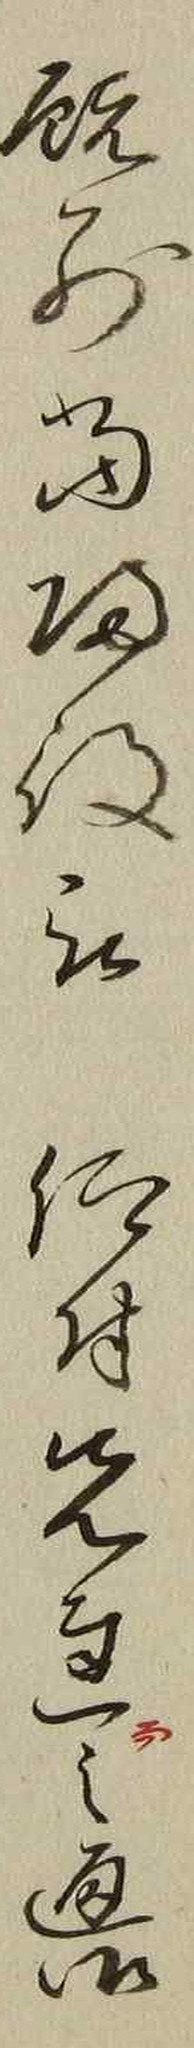厩別当帰役被仰付先達之通御
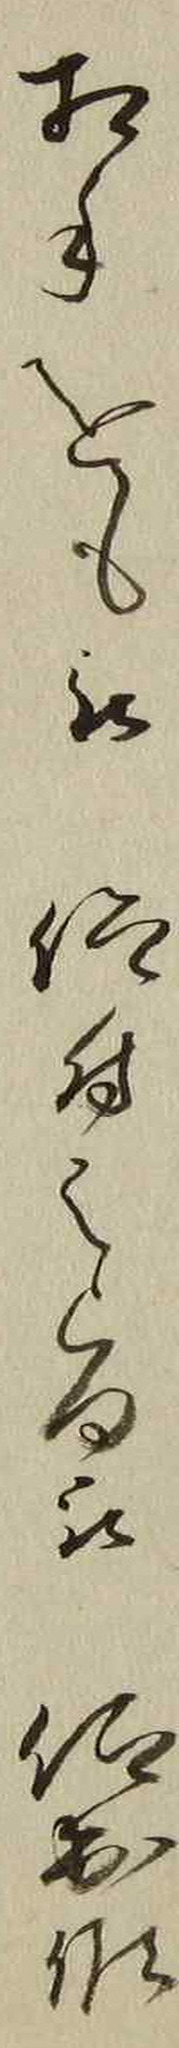相手をも被仰付之旨被仰出候
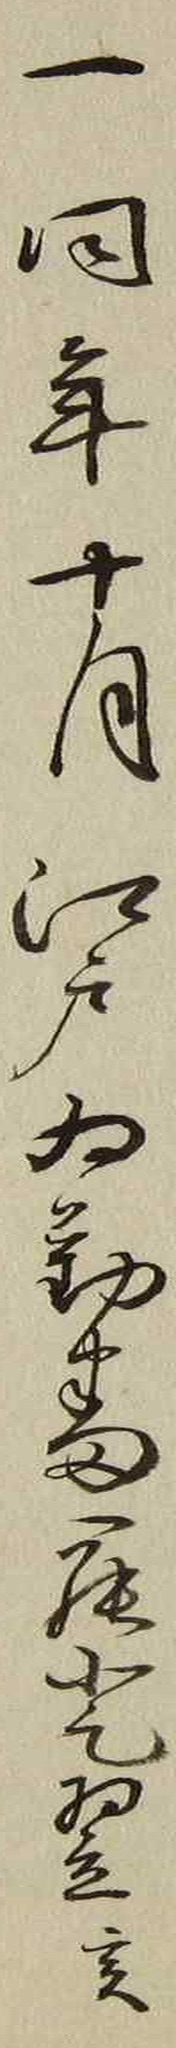一同年十月江戸為勤番罷登翌亥
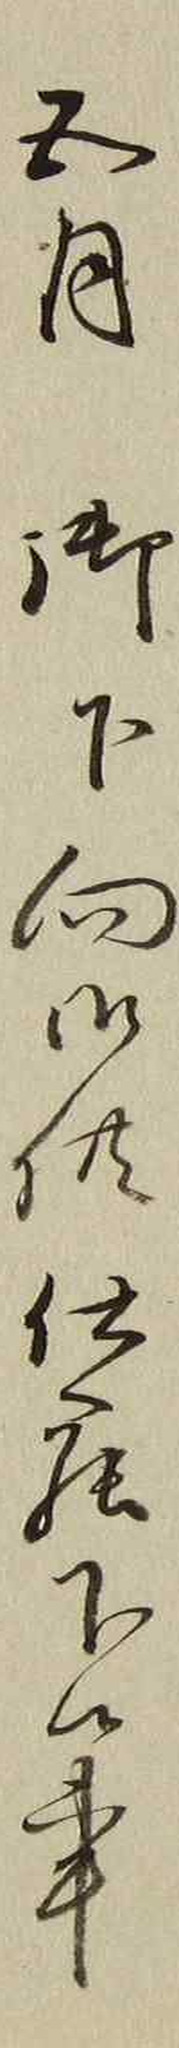五月御下向御供仕罷下候事
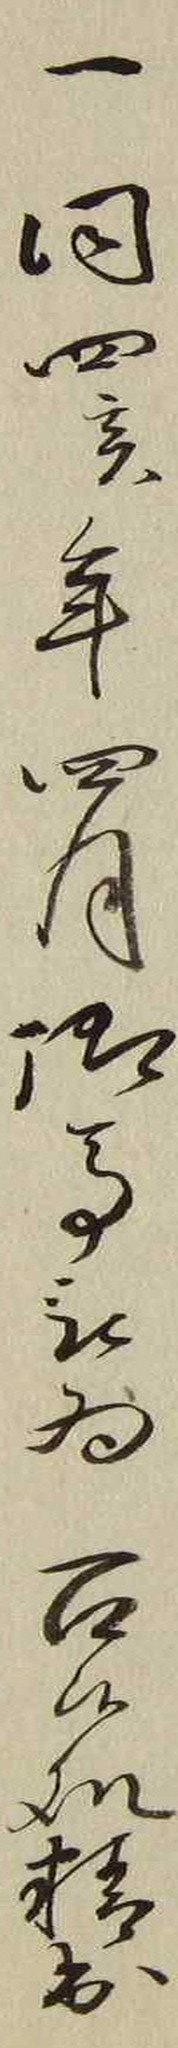一同四亥年四月御馬被為召候処精出
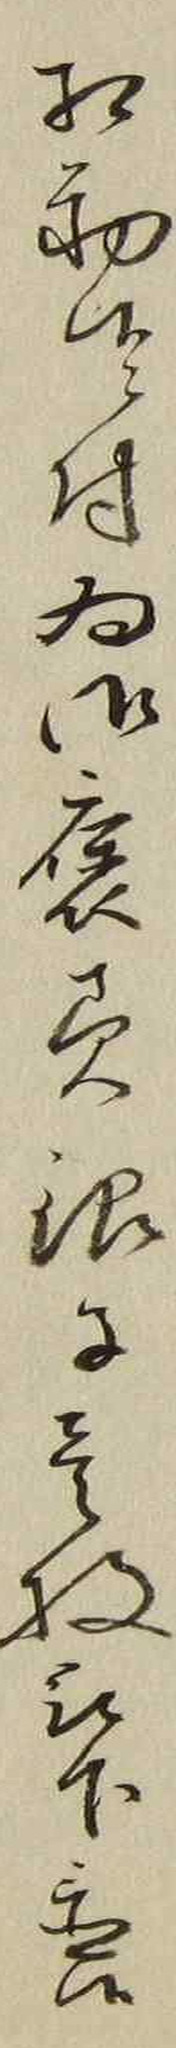相勤候ニ付為御褒美銀子壱枚被下置候

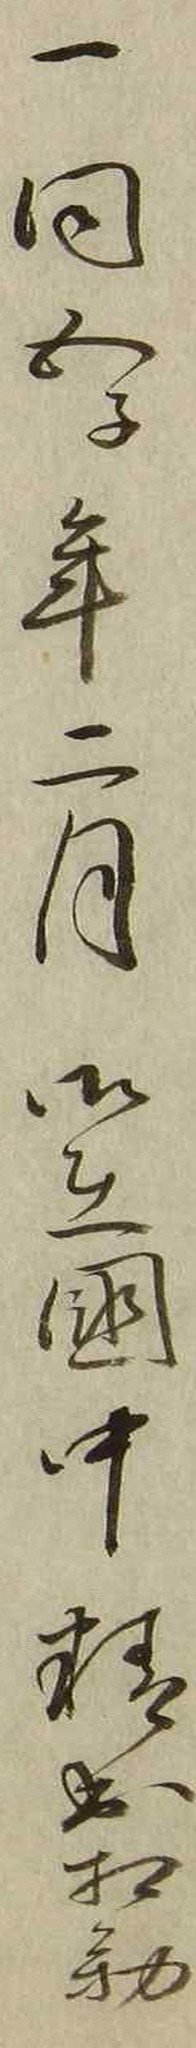一同五子年二月御在国中精出相勤
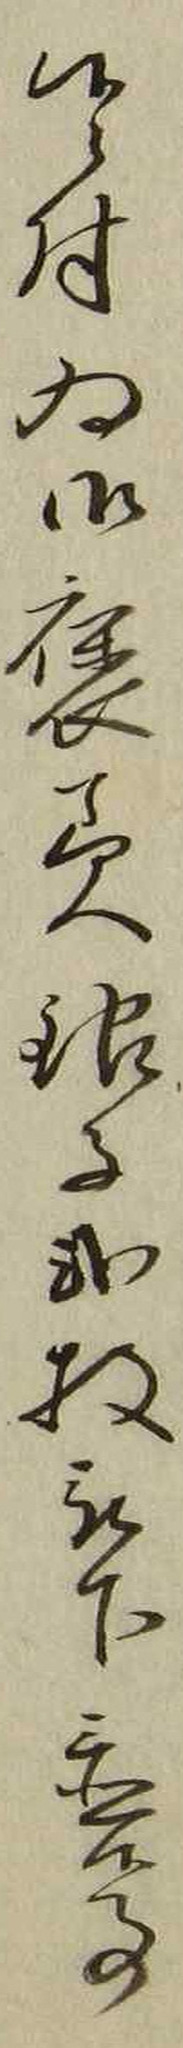候ニ付為御褒美銀子弐枚被下置候事
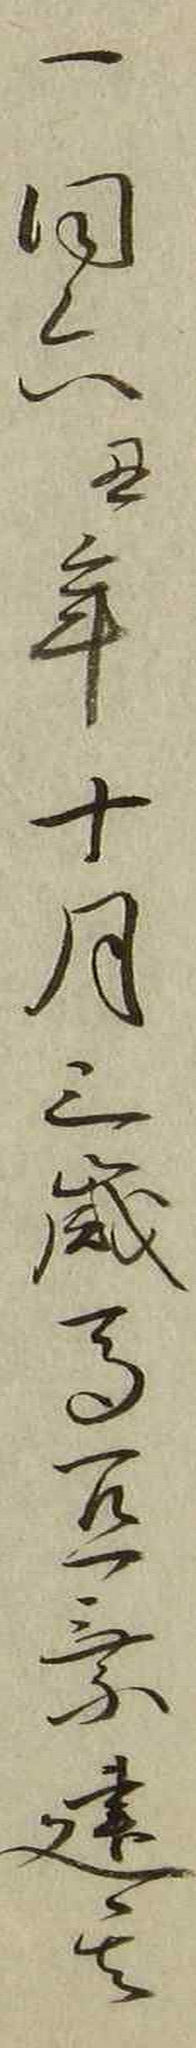一同六丑年十月三歳馬宜乗建其
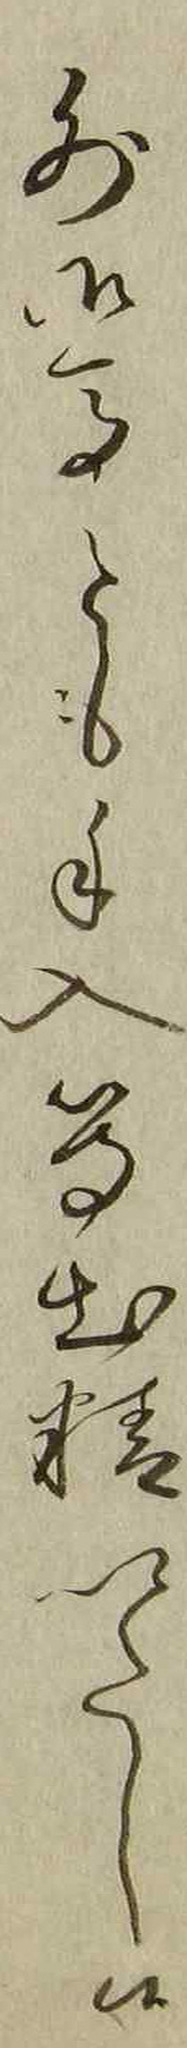前御馬とも手入等出精いたし候
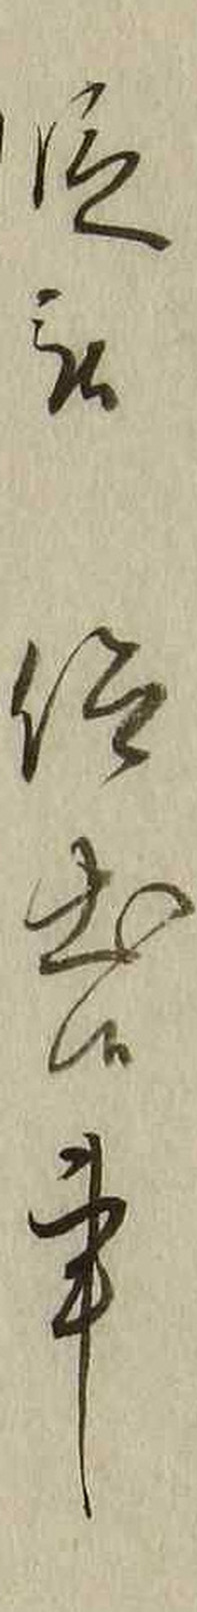段被仰出候事
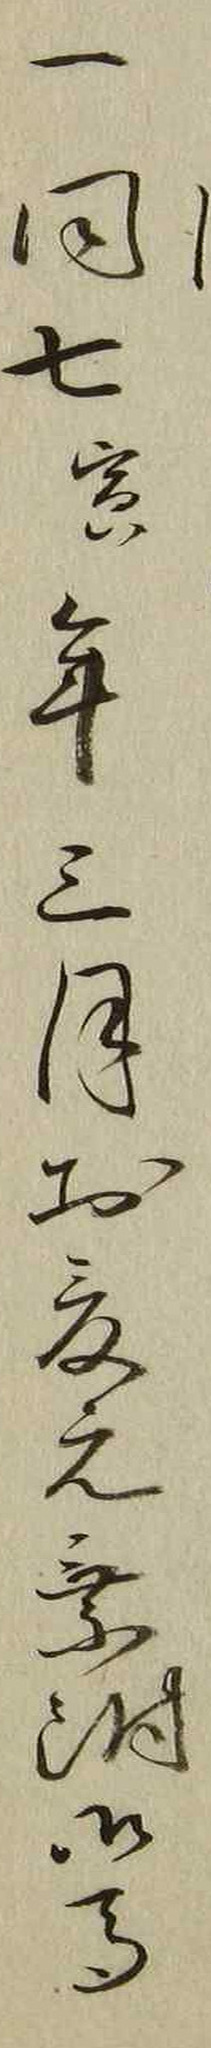一同七寅年三月於爰元乗附御馬
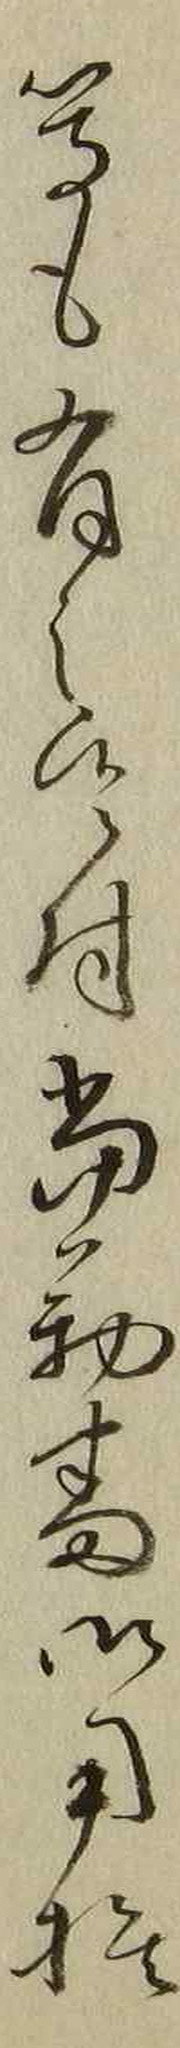等も有之候にニ付当勤番御用捨
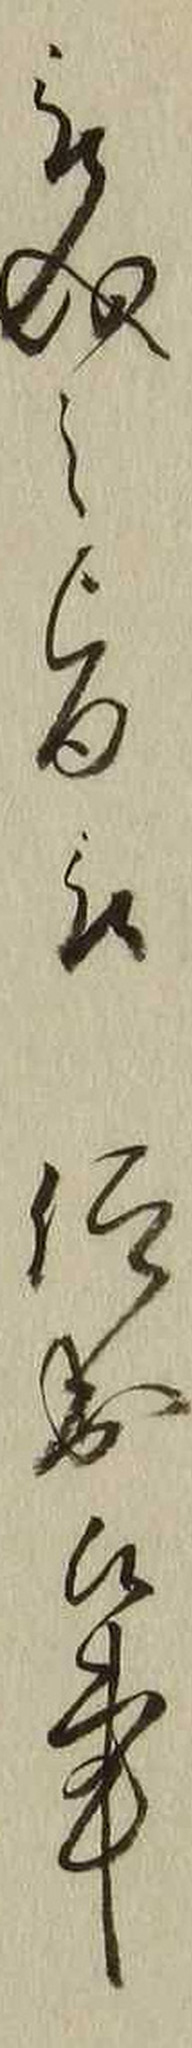被成之旨被仰出候事
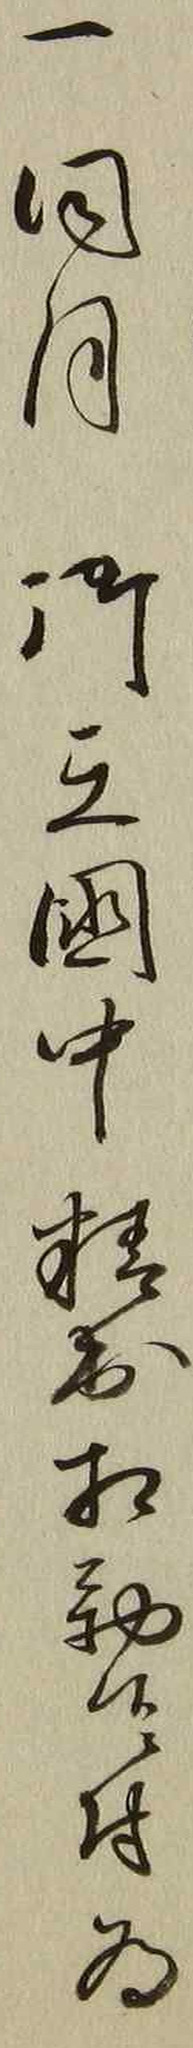一同月御在国中精出相勤候ニ付為
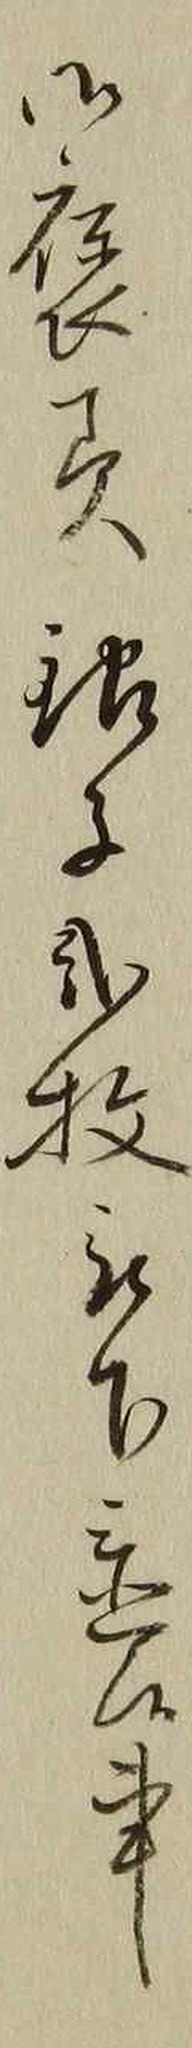御褒美銀子弐枚被下置候事
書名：諸士系譜　巻之3　い之部3
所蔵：会津若松市立会津図書館
